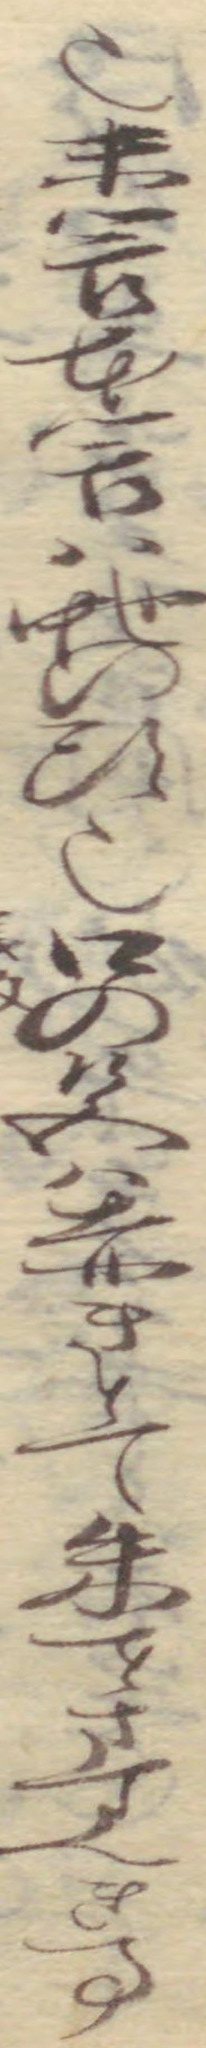也末筈本筈ハ虵の頭也口の色ハ赤きとて朱をさすへき事
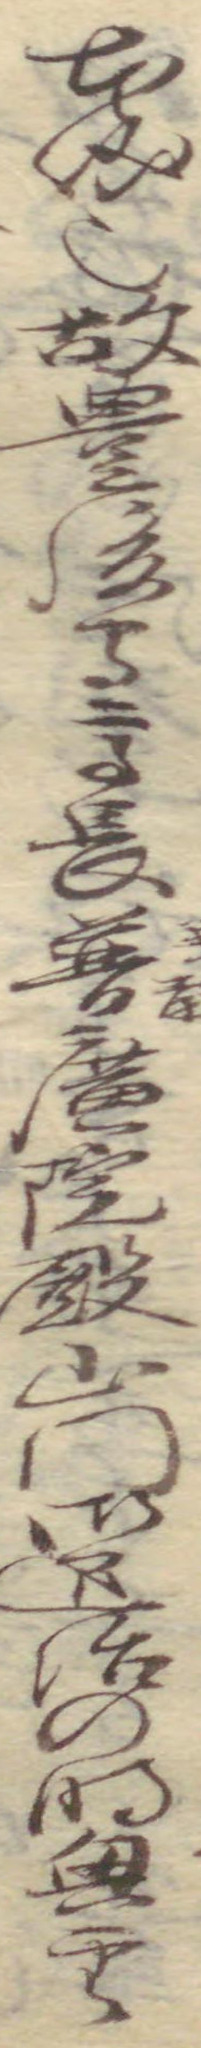本儀也故豊後守高長普広院殿山門御退治の時興雲
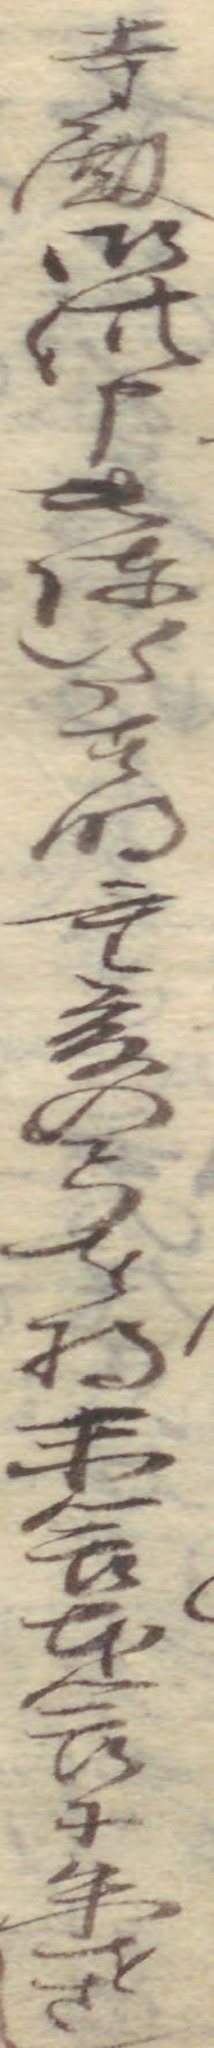寺殿御供申出陣いたす時重藤の弓を持末筈本筈に朱をさし
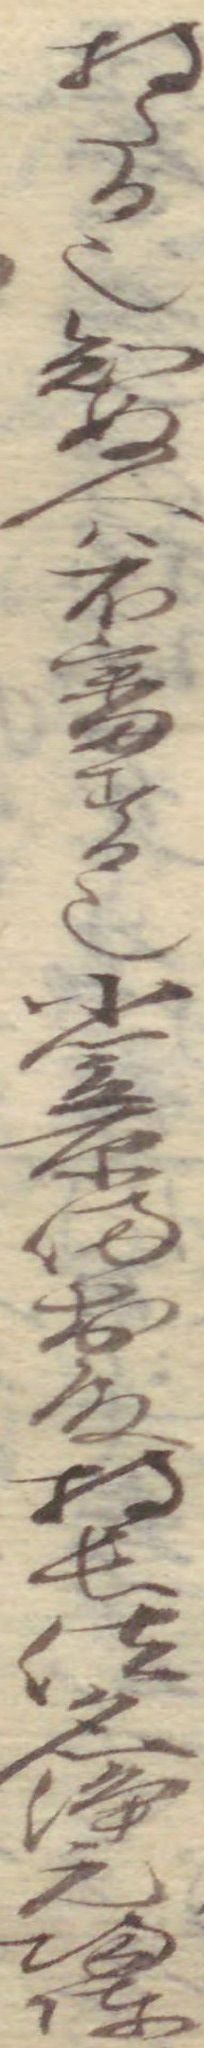持たる也知ぬ人ハ不審する也小笠原備前守持長法名浄元帰陣
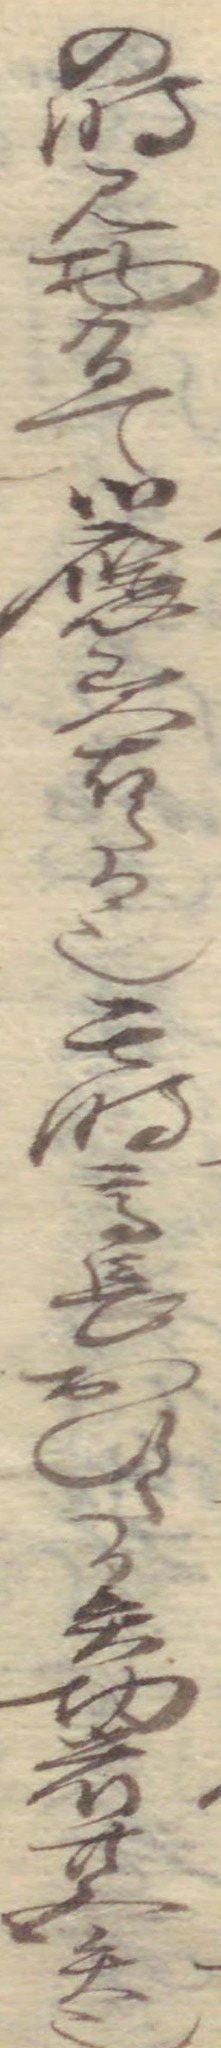の時見物有て御褒美有たる也其時高長おひたる矢切符廿五矢也
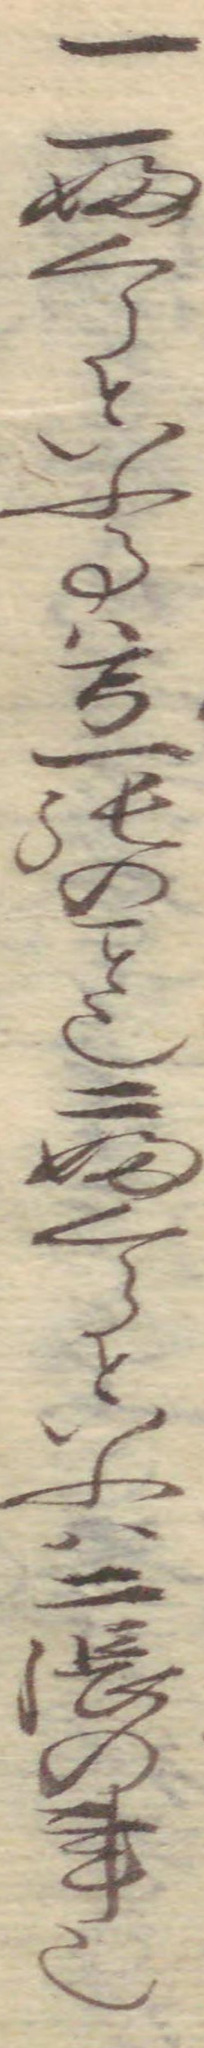一一ふくらといふ事ハ弓一張のこと也二ふくらといふハ二張の事也
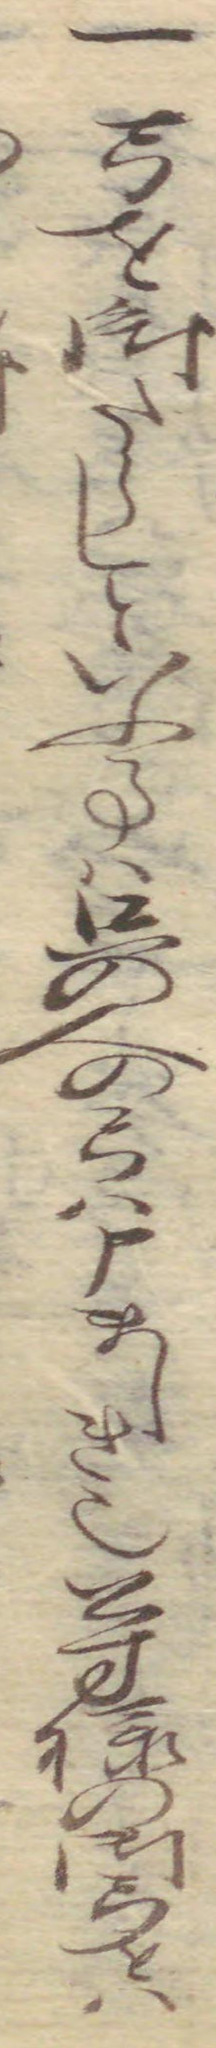一弓を御たらしといふ事ハ只の人の弓ハ申ましき也公方様の御弓をハ
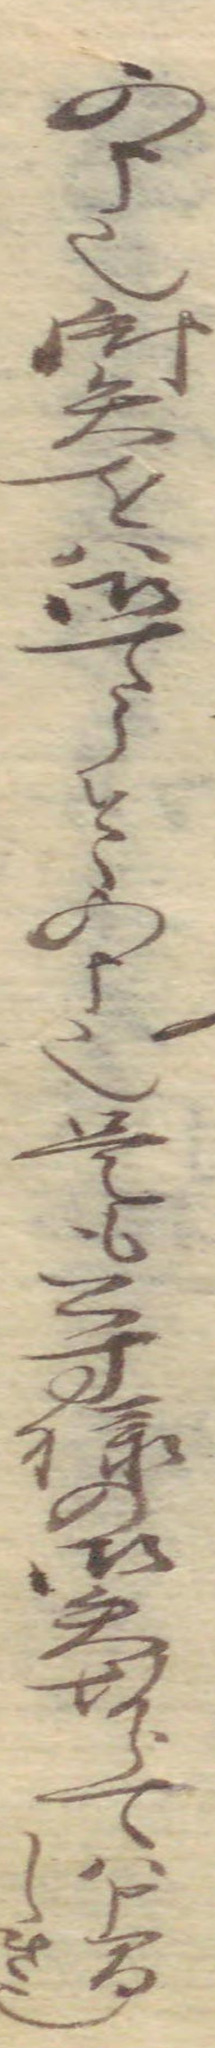可申也御矢をハ御てうとゝ可申也是も公方様の御矢ならてハ申間しき也
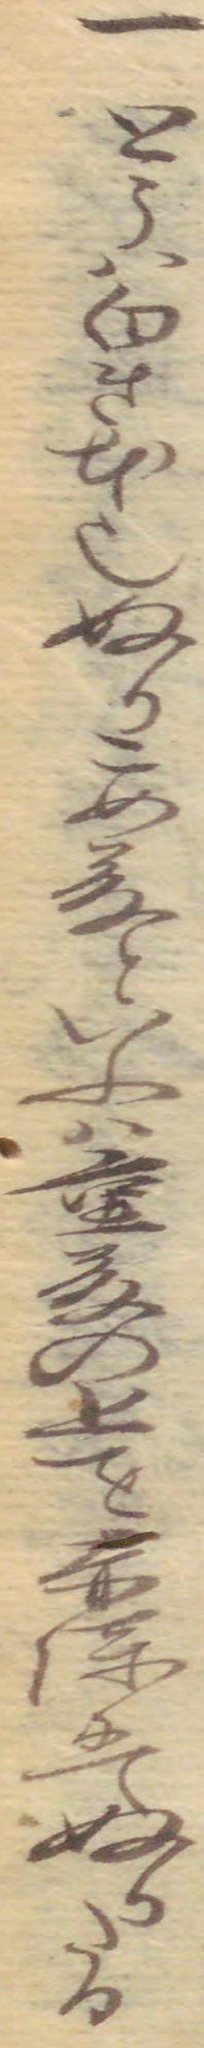一とうハ白き本也ぬりこめ藤といふハ重藤の上を赤漆にてぬりたる

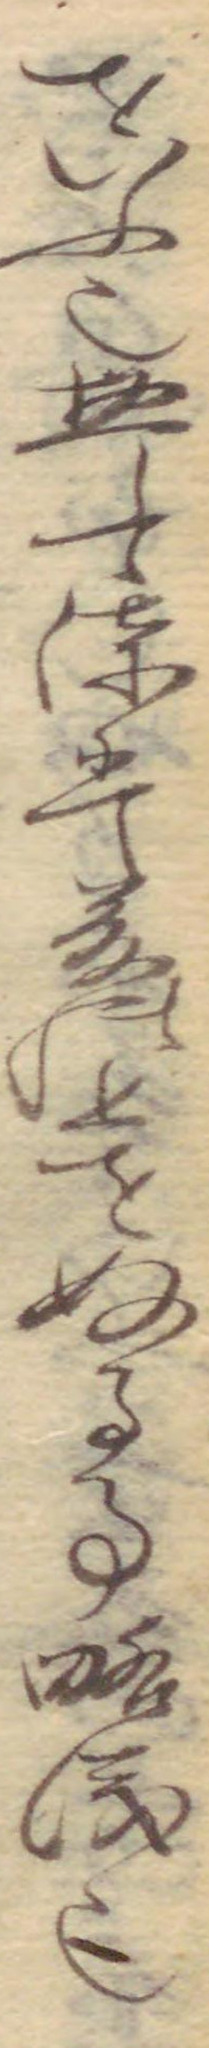をいふ也惣して漆にて藤の上をぬる事略儀也
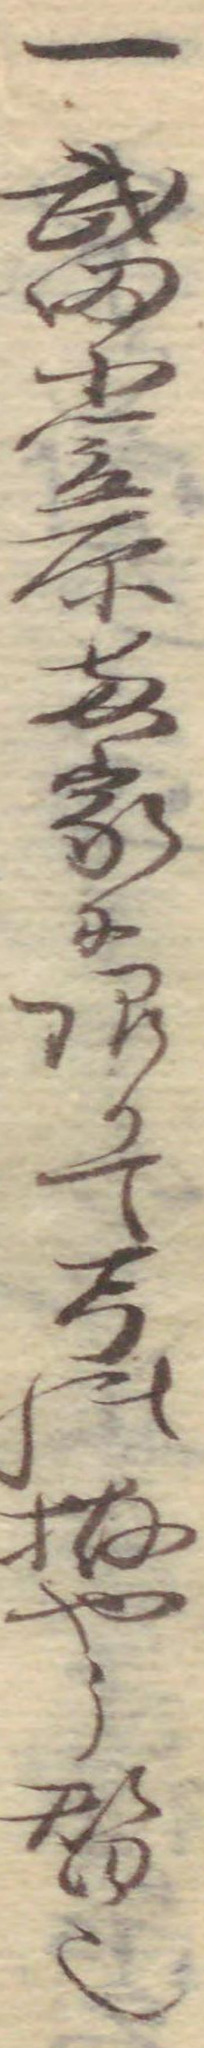一武田小笠原両家に限りて弓の拵やう替也
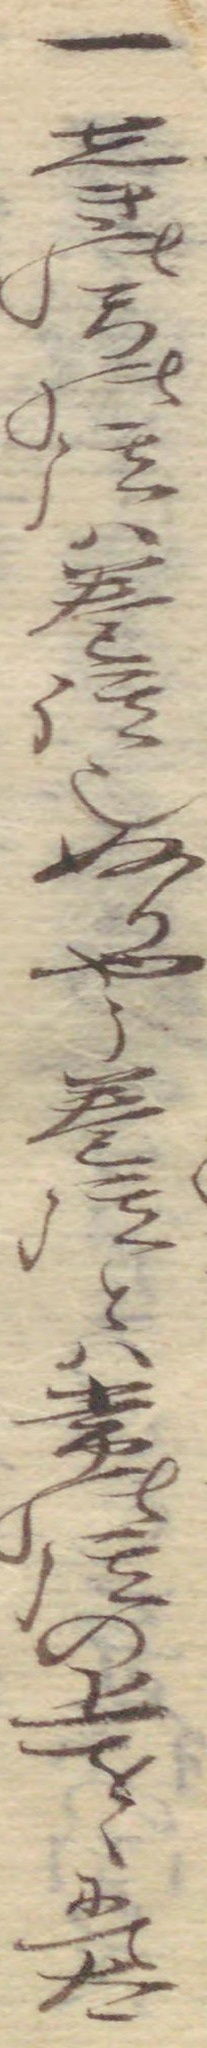一しきの弓の弦ハ巻弦也ぬりやう巻弦とハ常の弦の上をゝにて太
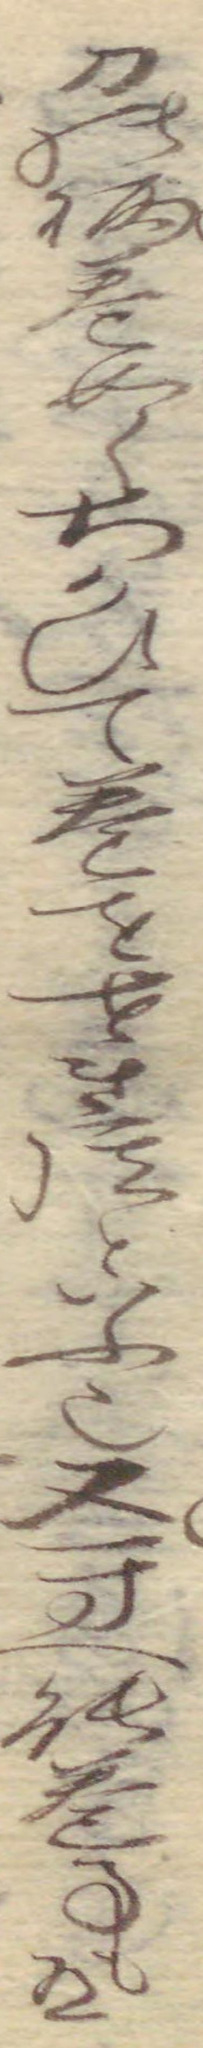刀の柄巻如くちかひて巻をせき弦といふ也又一方へ能巻事も有
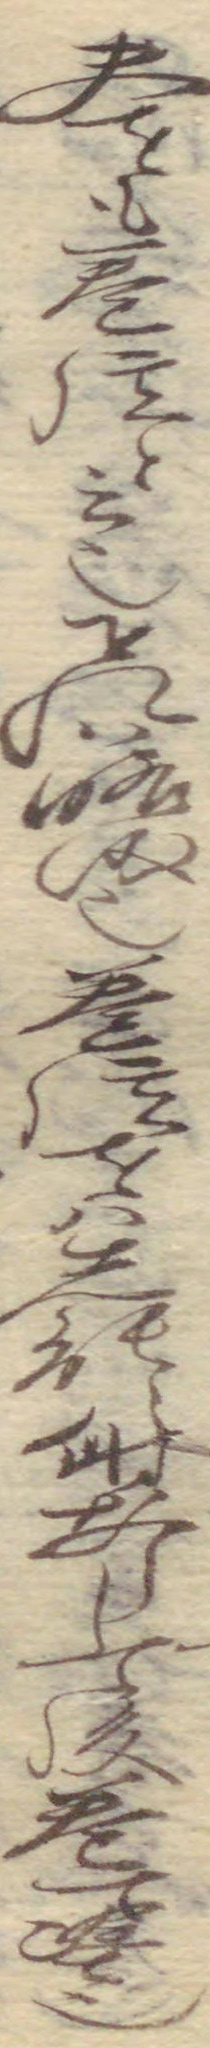夫を巻弦と云也それは略儀也巻弦をハ先能々射ならして後巻て塗也
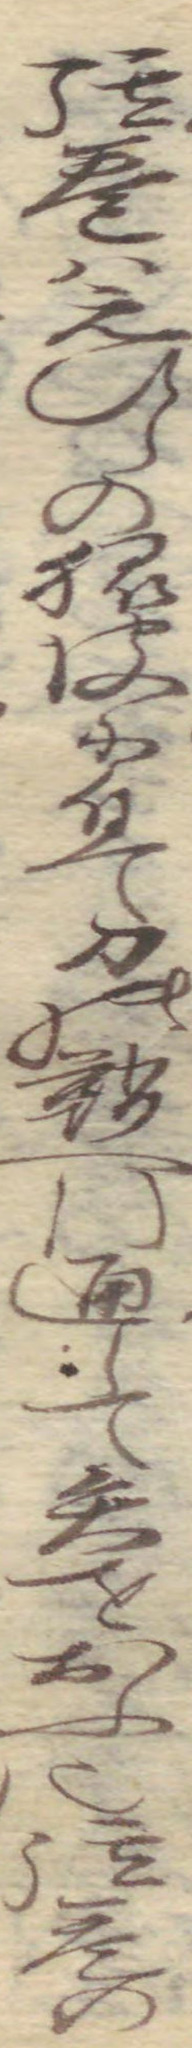一弦巻ハえひらの脇皮に付て刀の鞘へ引通して矢をおふ也弦巻の
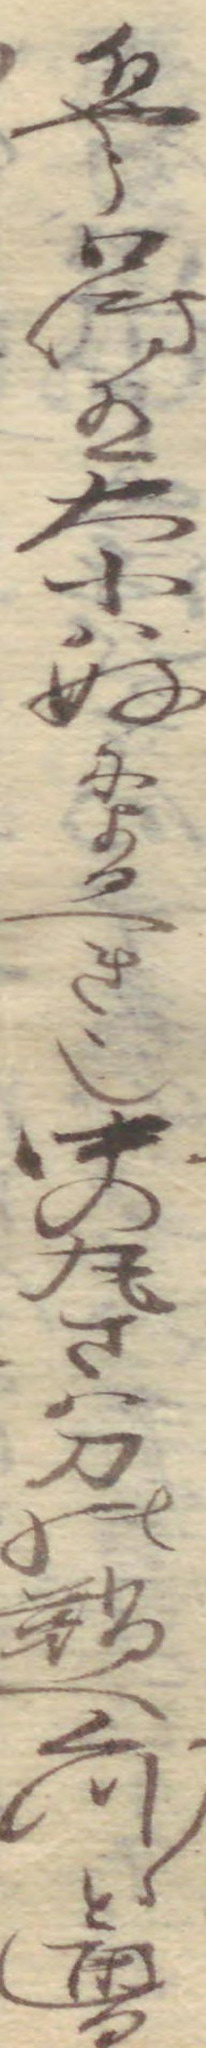付やう口伝有大小ハ好によるへき也中の丸さハ刀の鞘へくつ〳〵と通る
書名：鶯宿雑記. 巻199-200
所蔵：国立国会図書館 National Diet Library, JAPAN
